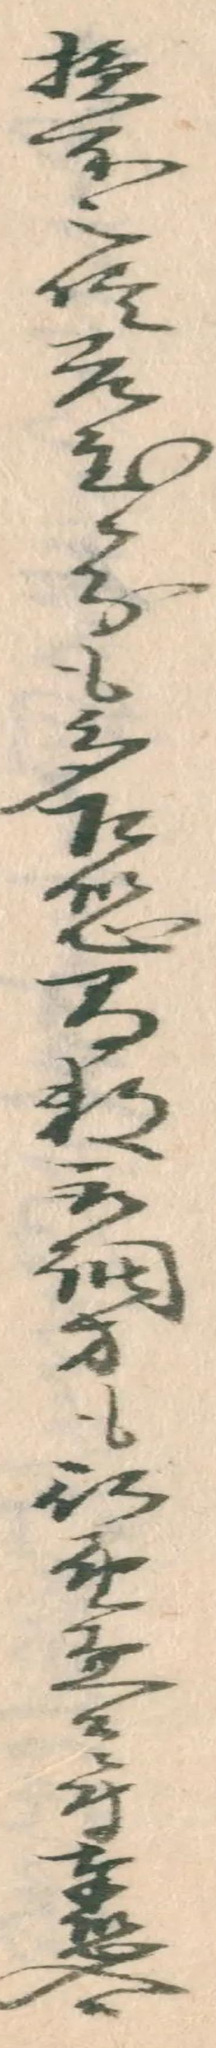損所之侭差置候分も多乍恐間数取調方も行届兼候ニ付奉恐入候

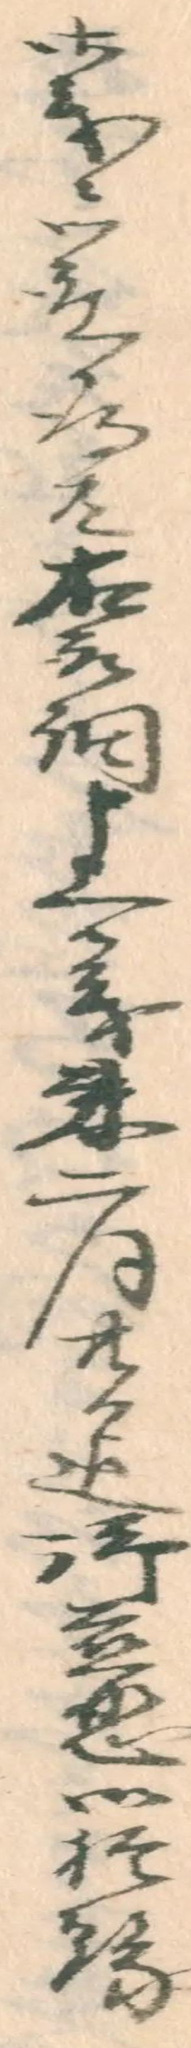御義ニ御座候得共右取調申上候義来二月廿日迄御慈悲御猶予
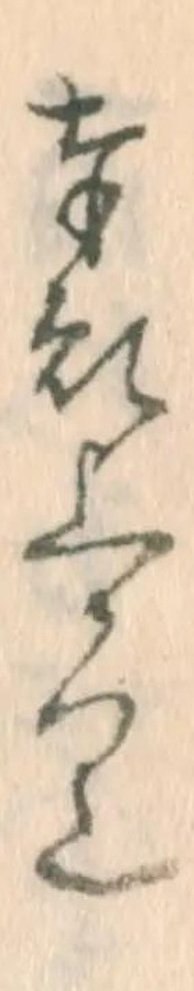奉願上候以上
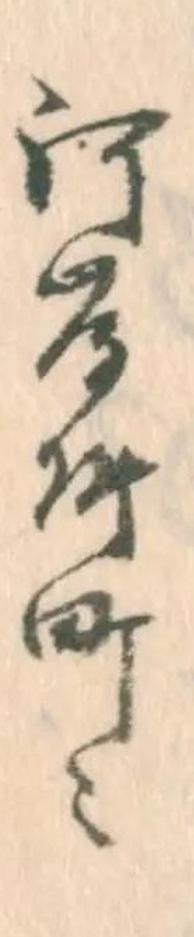河岸附町〻
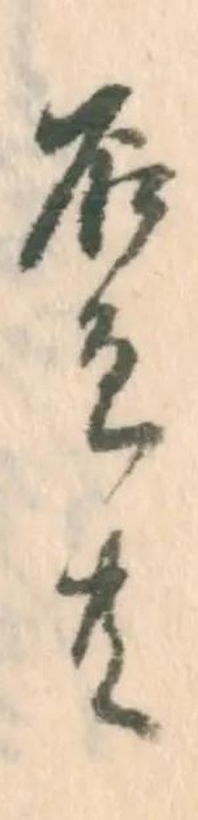名主共
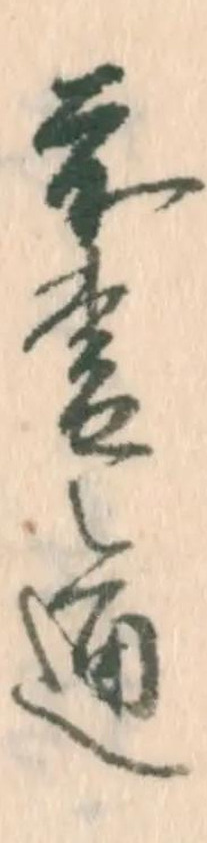前書之通
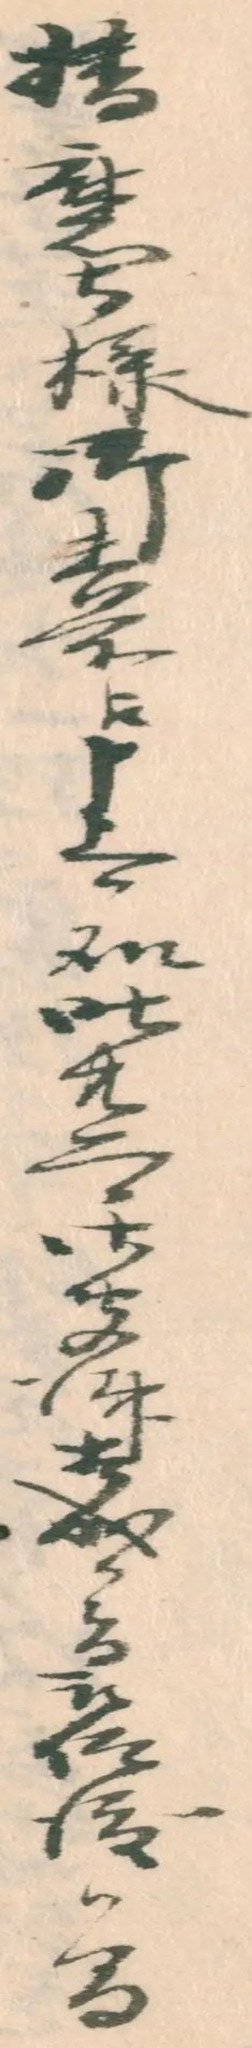播磨寺様御番所江申上候処昨廿二日御聞済相成候旨被仰渡候間
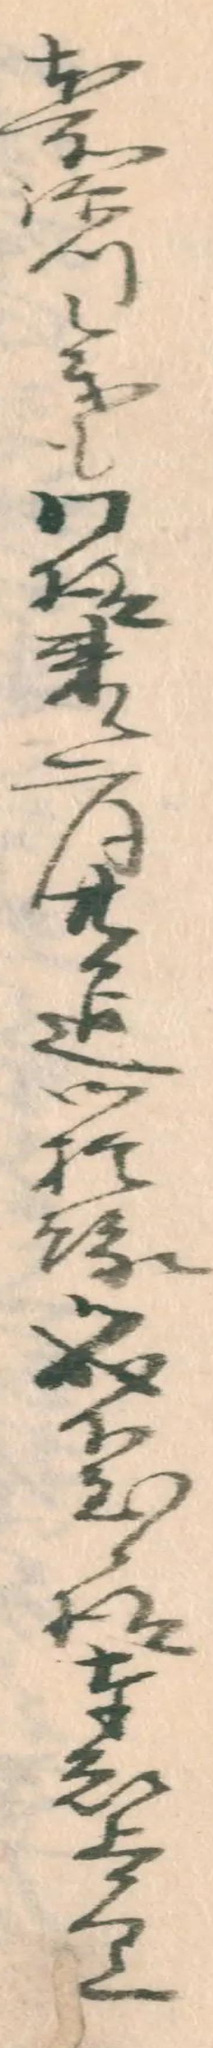本所深川之義も同様来ル二月廿日迄御猶予被成下置候様奉願上候以上
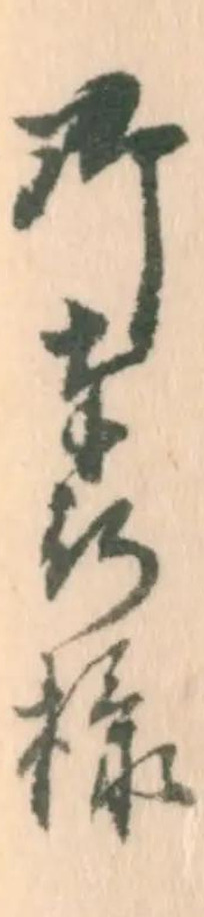御奉行様

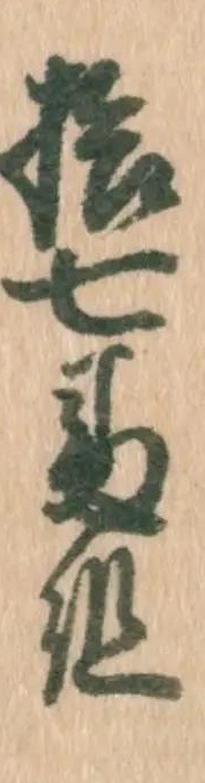拾七番組
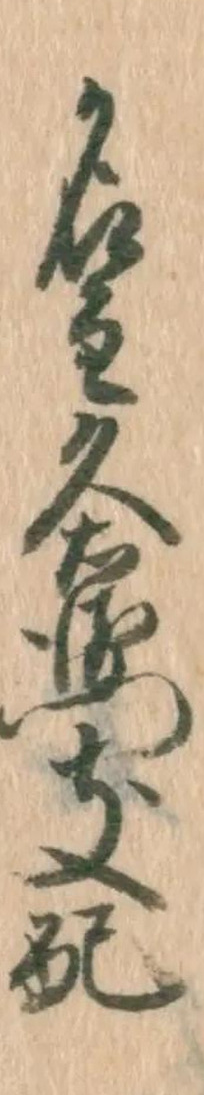名主久右衛門支配
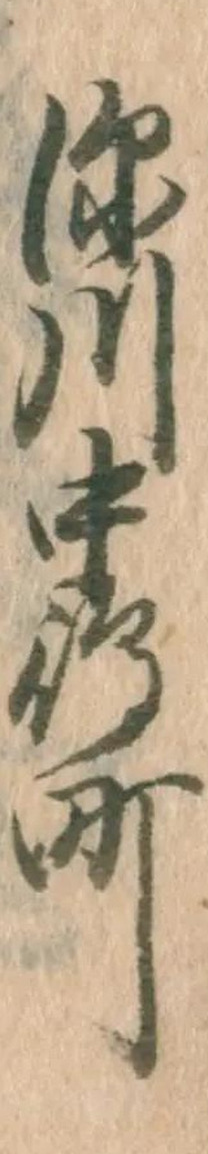深川中嶋町
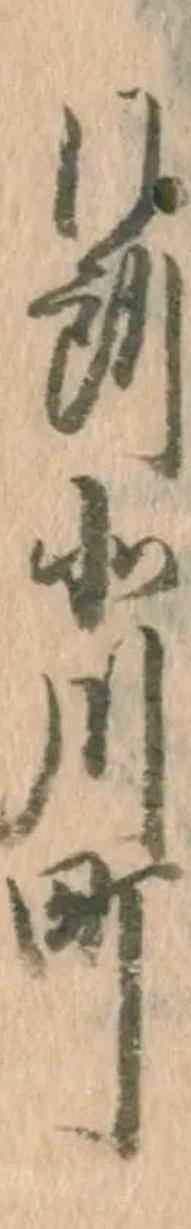同所北川町
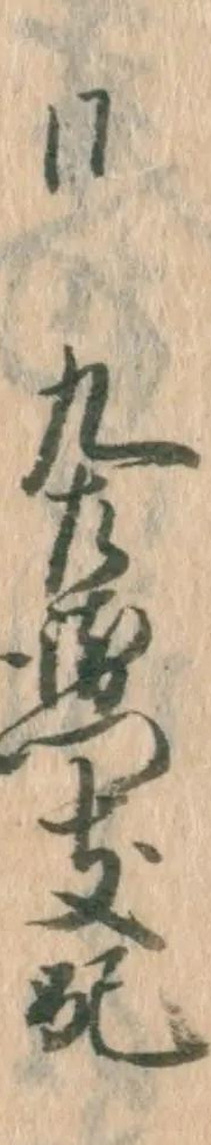同九左衛門支配
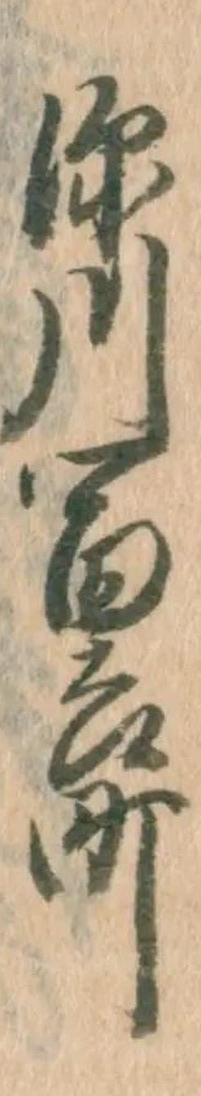深川富吉町
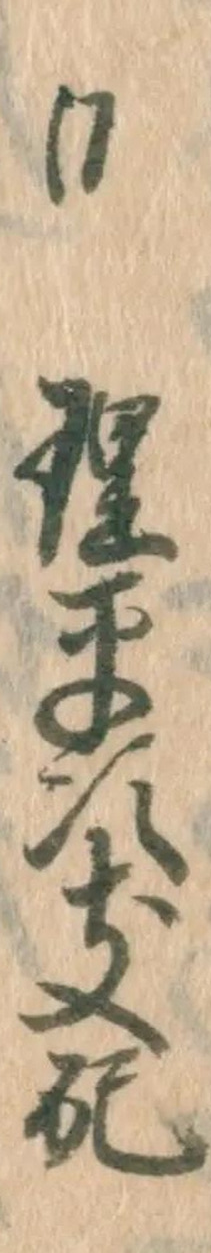同理平次支配
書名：地震災書留 2巻. [1] 内表紙に「地震災書留　安政二卯年　但本所深川御用屋敷地代免除調」とあり
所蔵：国立国会図書館 National Diet Library, JAPAN
